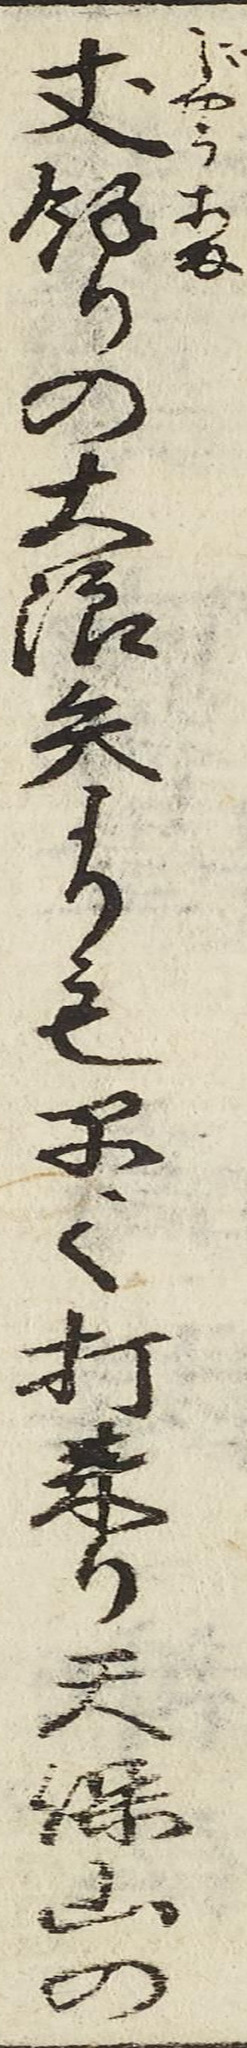丈余りの大浪矢よりも早く打来り天保山の
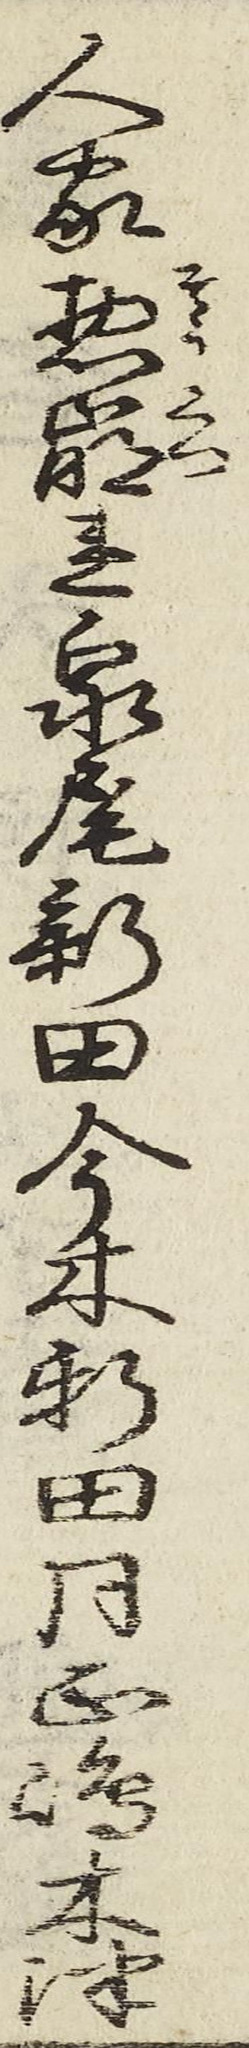人家惣崩れ泉尾新田今木新田月正嶋木津
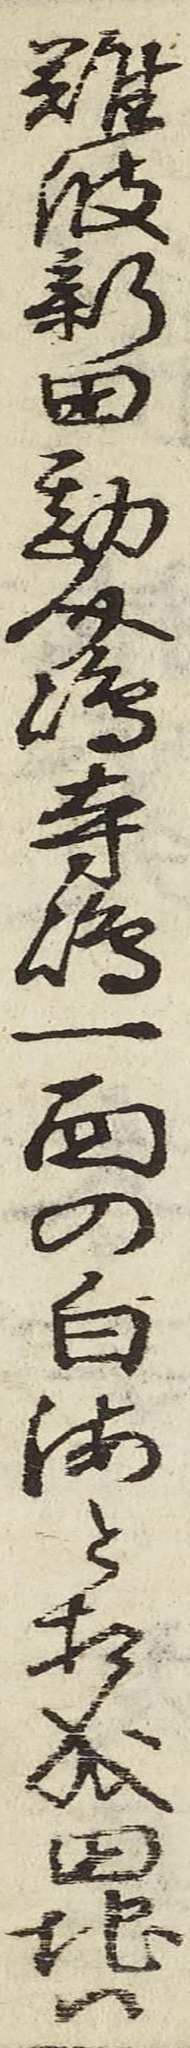難波新田勘介嶋寺嶋一面の白海と相成田地は
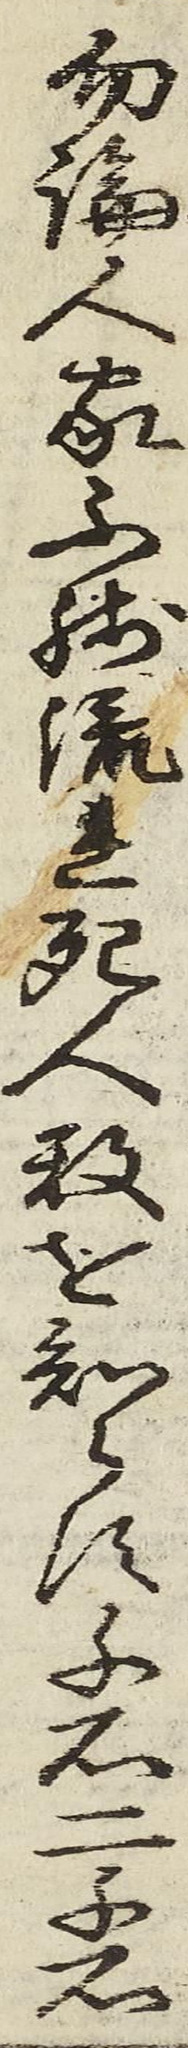勿論人家不残流れ死人数を知らす千石二千石
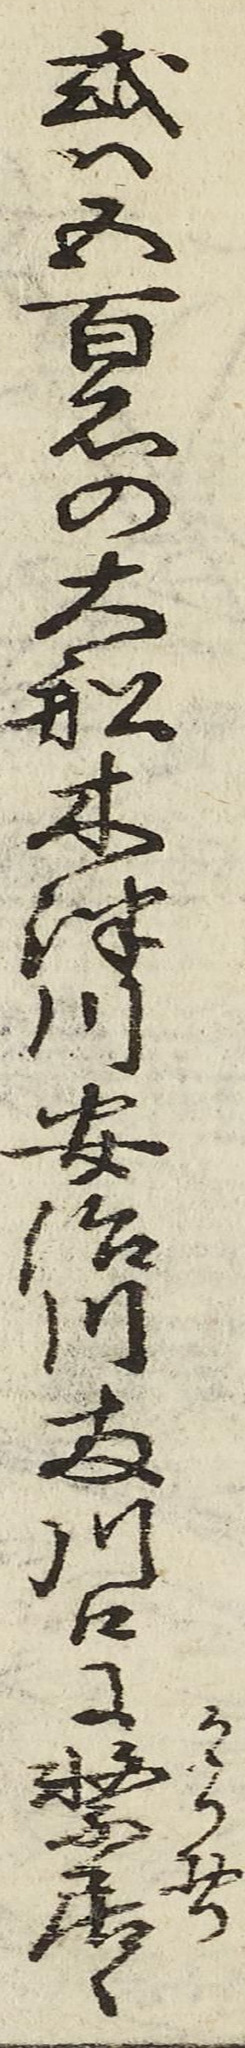或は五百石の大船木津川安治川両川口に繋居候
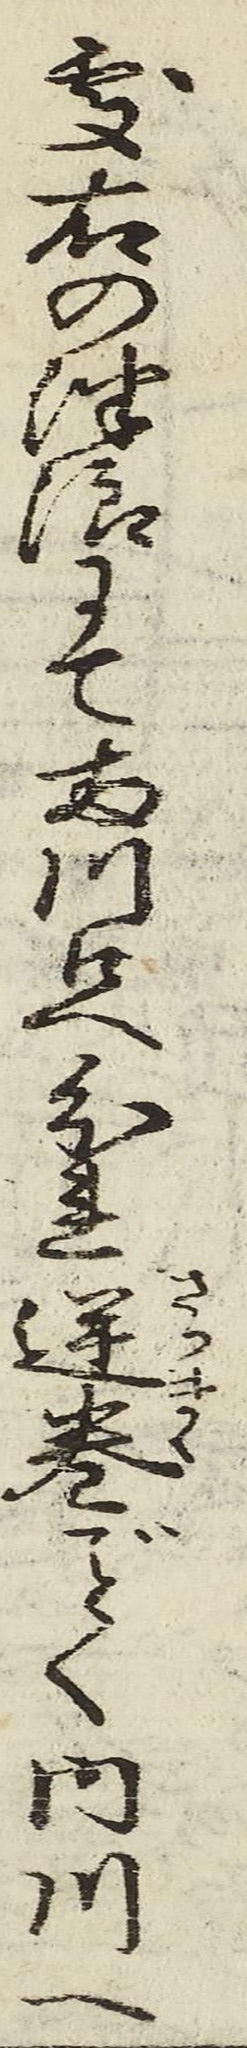処右の津浪にて両川口へ分れ逆巻ごとく内川へ
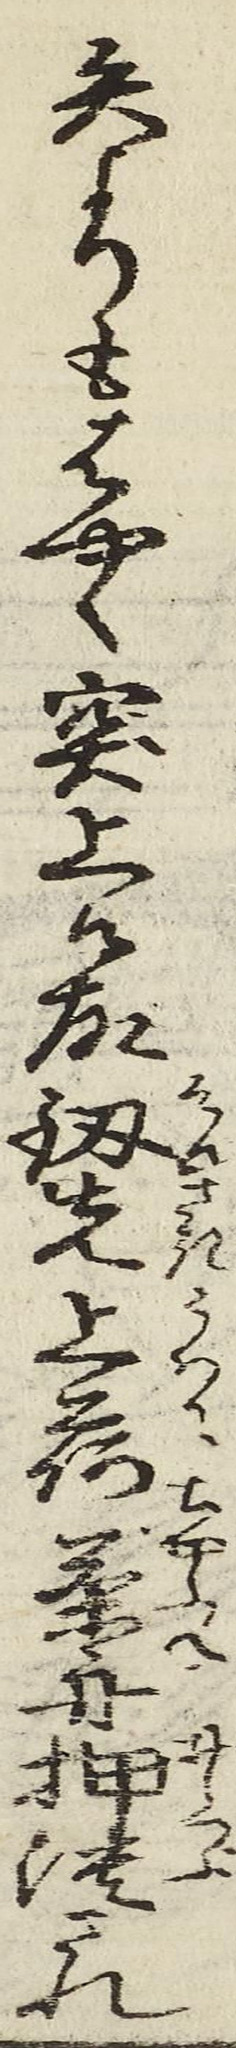矢よりもはやく突上候故剣先上荷茶舟押潰され
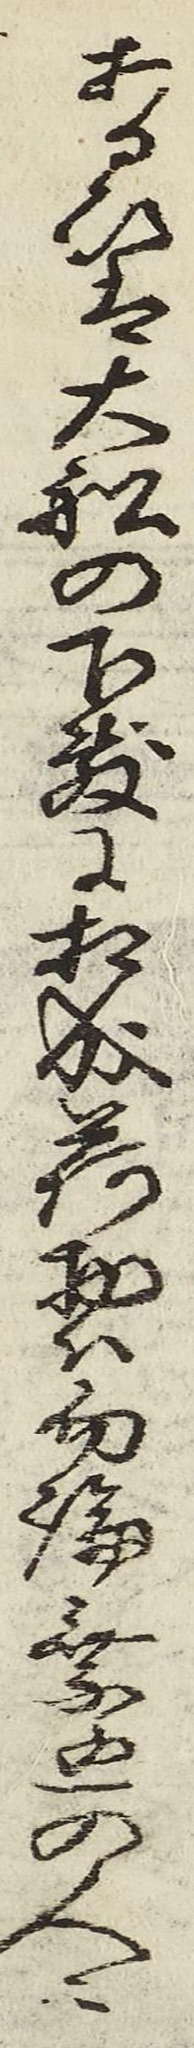あるひは大船の下敷に相成荷物は勿論乗込の人々
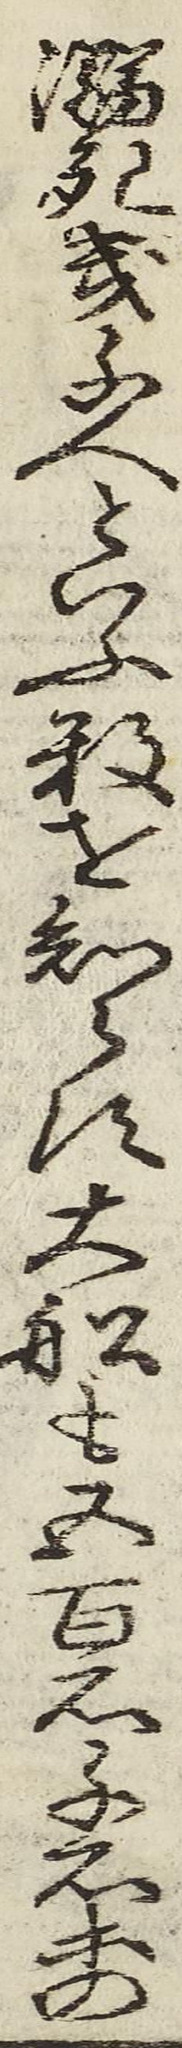溺死幾千人といふ数を知らす大船も五百石千石等の
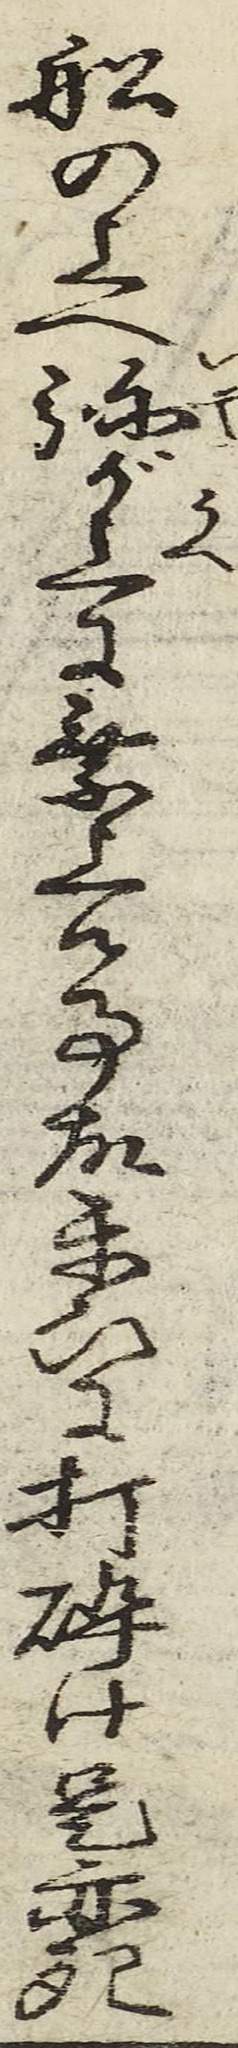船の上へ弥が上に乗上候事故互ひに打砕け是亦死
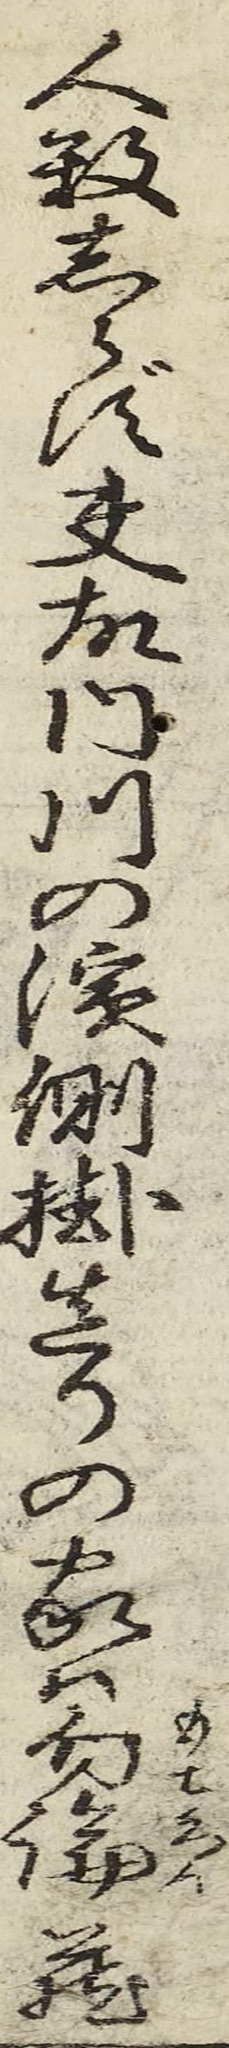人数しらず夫故内川の浜側掛造りの家は勿論蔵

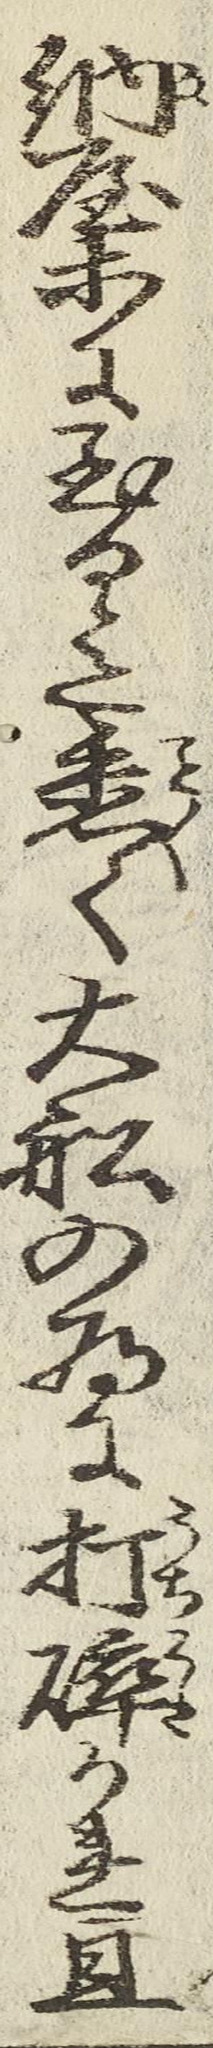納屋等に至る迄悉く大船の為に打砕かれ且
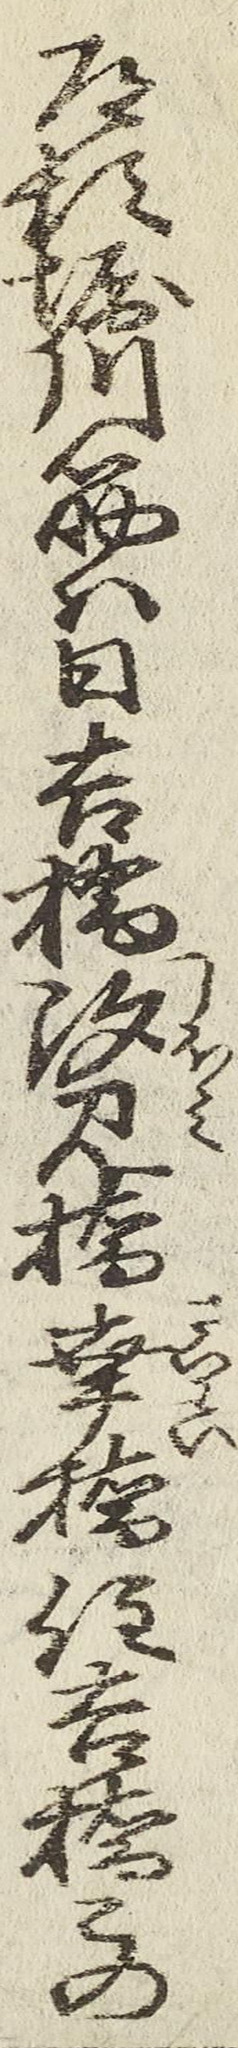道頓堀川筋は日吉橋汐見橋幸橋住吉橋この
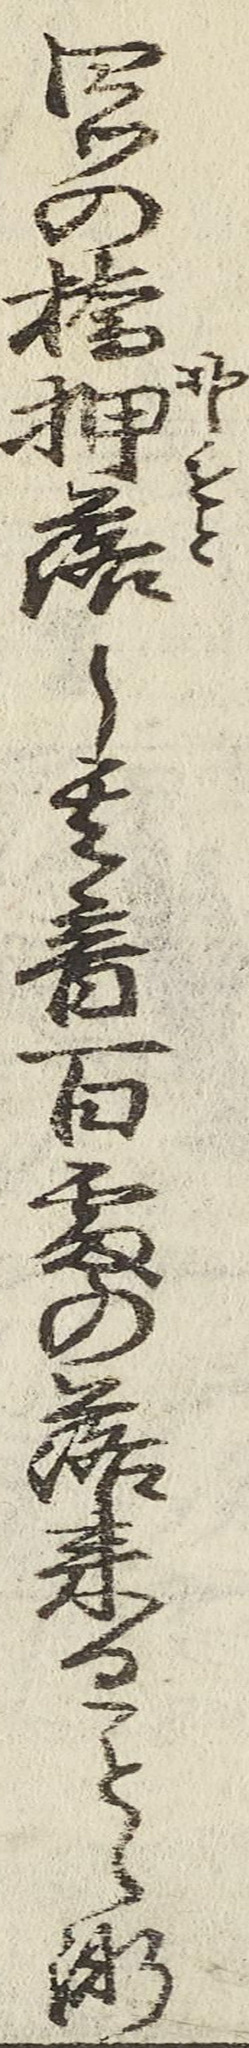四ツの橋押落し其音百雷の落来ることし漸
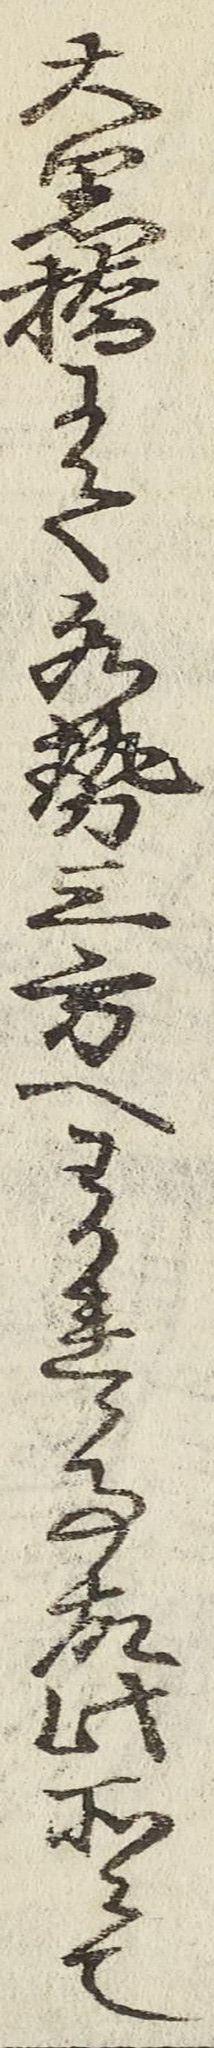大黒橋にて水勢三方へわかれ候事故此所ニて
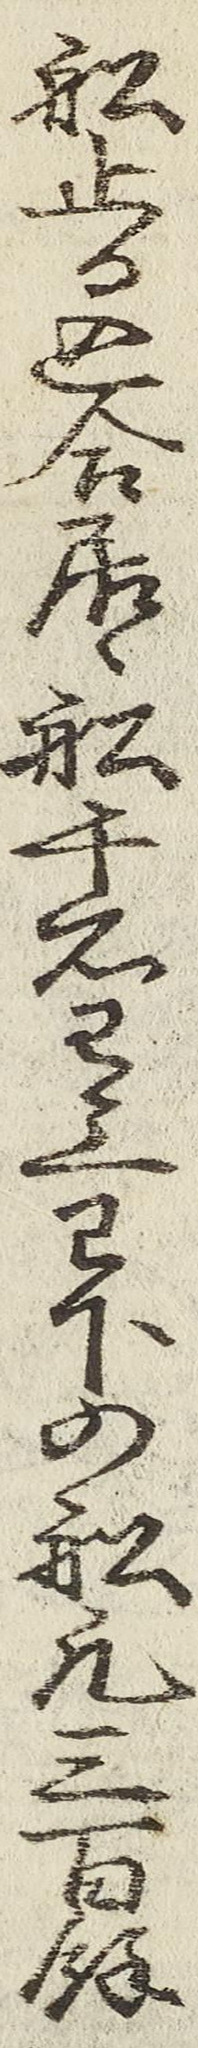船止る込合居候船千石已上已下の船凡三百余
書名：地震津浪末代噺の種　全
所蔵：東京大学地震研究所図書室 Earthquake Research Institute Library, The University of Tokyo, JAPAN
